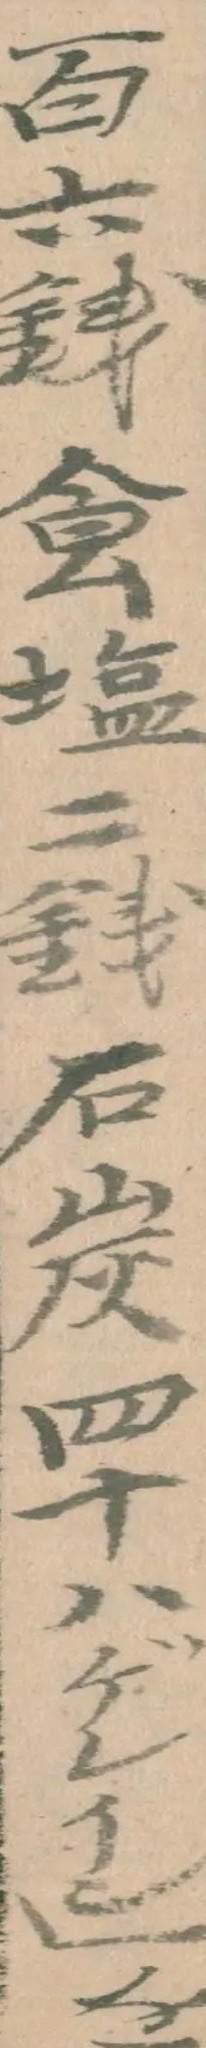百六銭食塩二銭石炭四十八ゲレイン)を
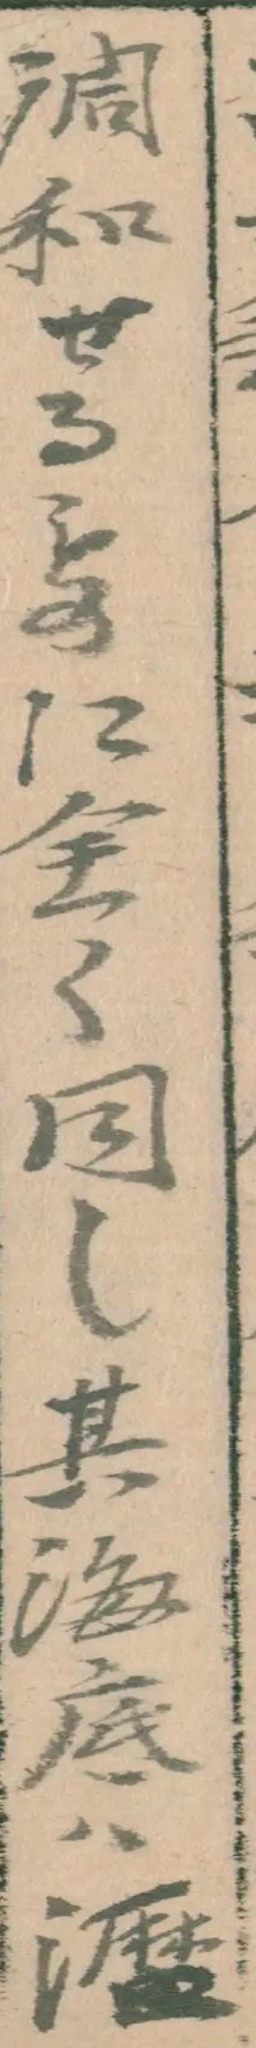調和せるものに全く同し其海底ハ瀝

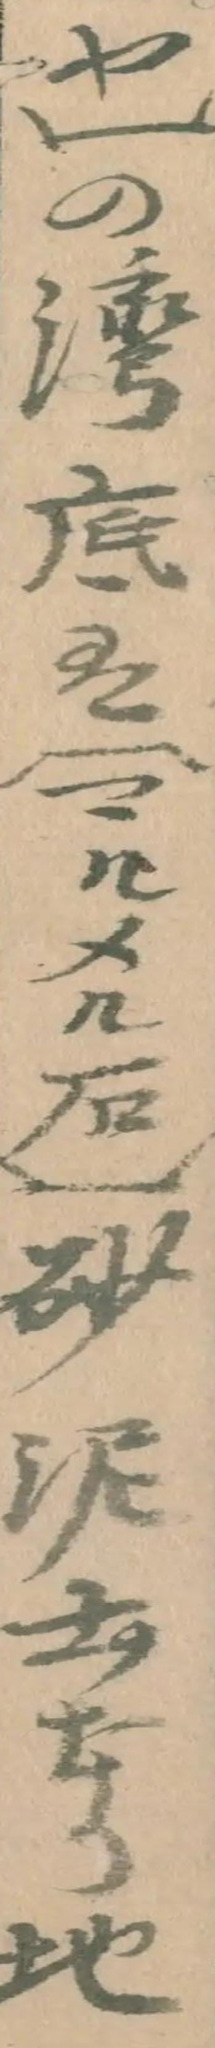ヤ)の湾底は(マルメル石)砂泥土なり地
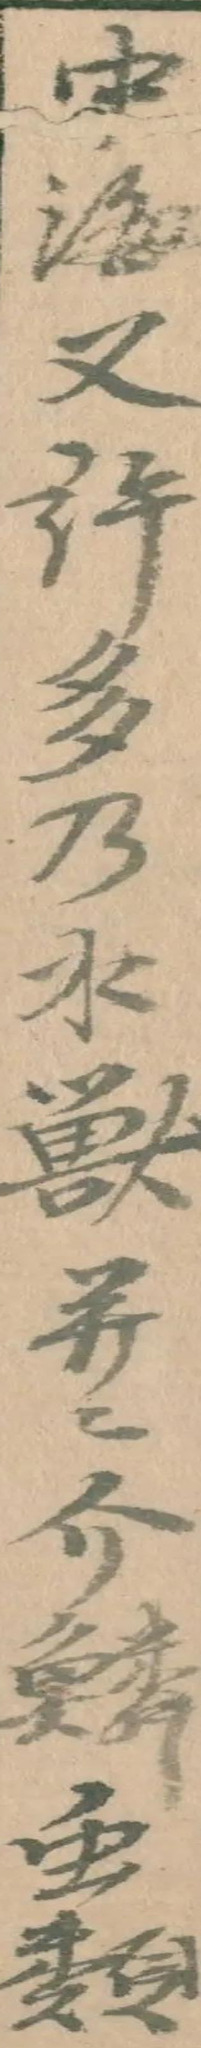中海又許多の水獣并ニ介鱗ノ虫類
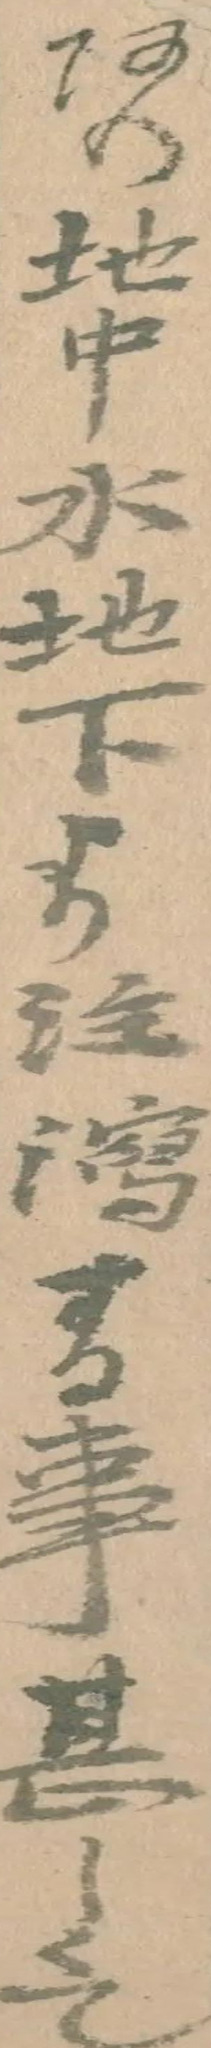あり地中水地下より注瀉する事甚しくて
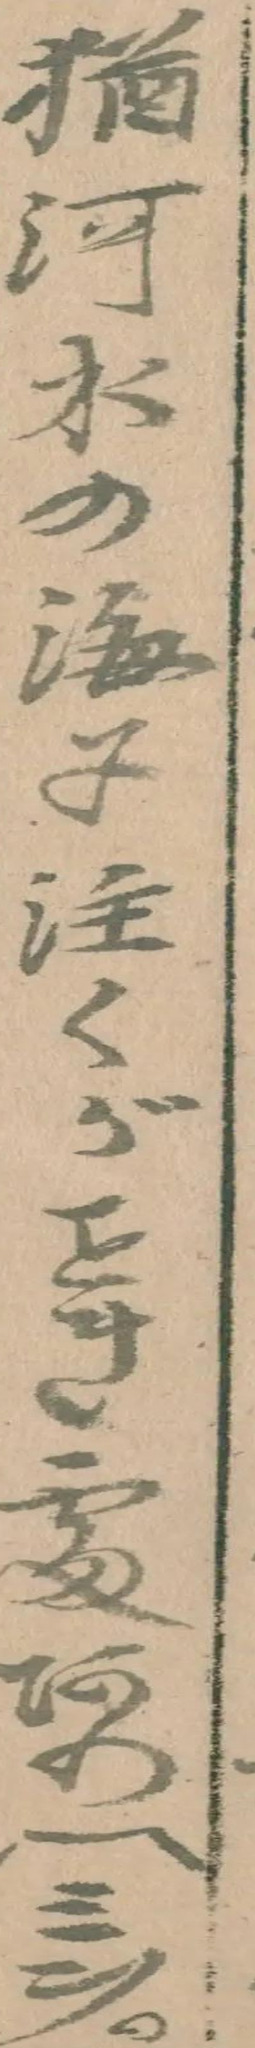猶河水の海に注くがことき処あり(ミヲ・
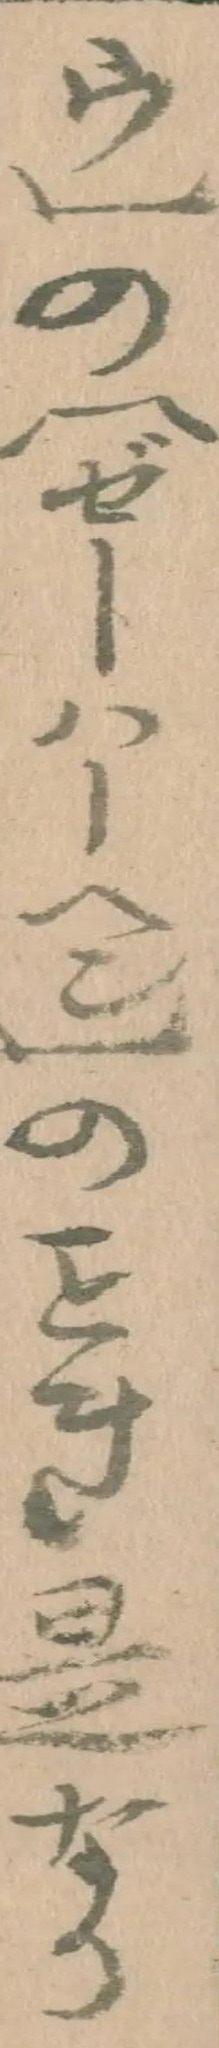ウ)の(ゼーハーヘン)のことき是なり
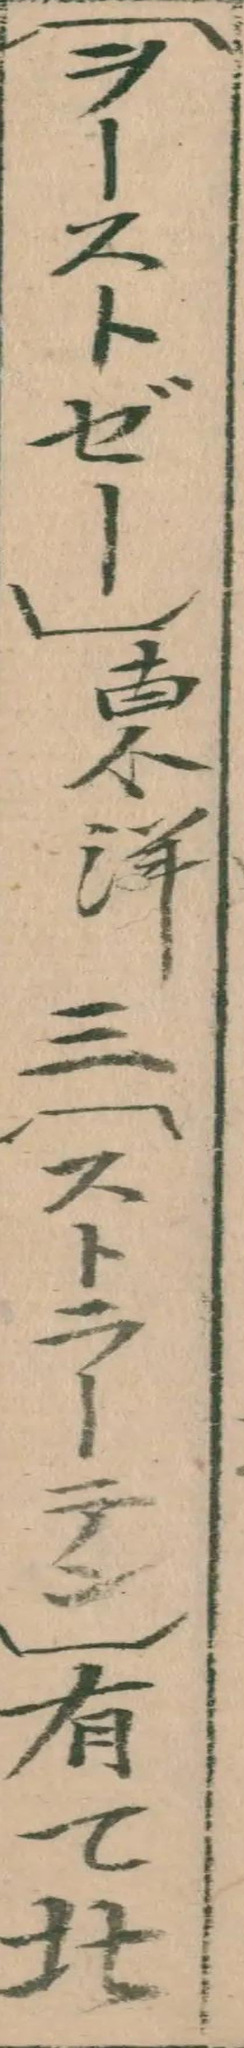(ヲーストゼー)東洋三(ストラーテン)有て北
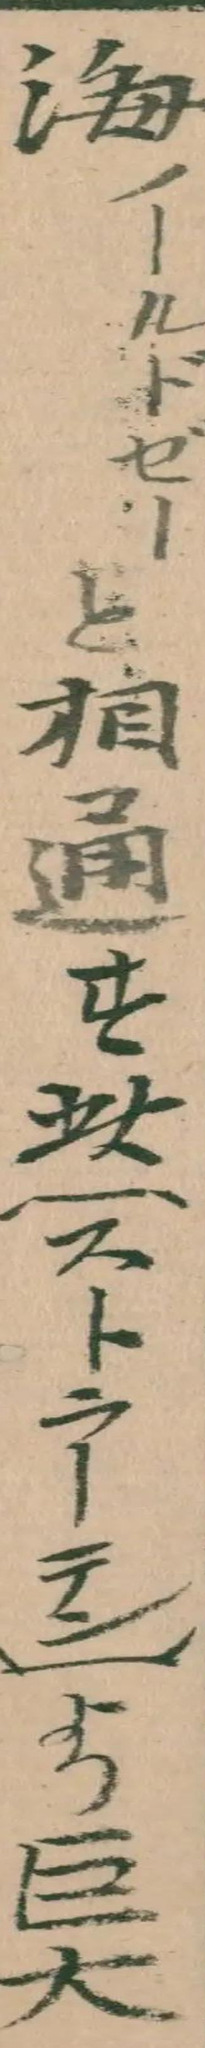海ノールドゼーと相通す此(ストラーテン)より巨大
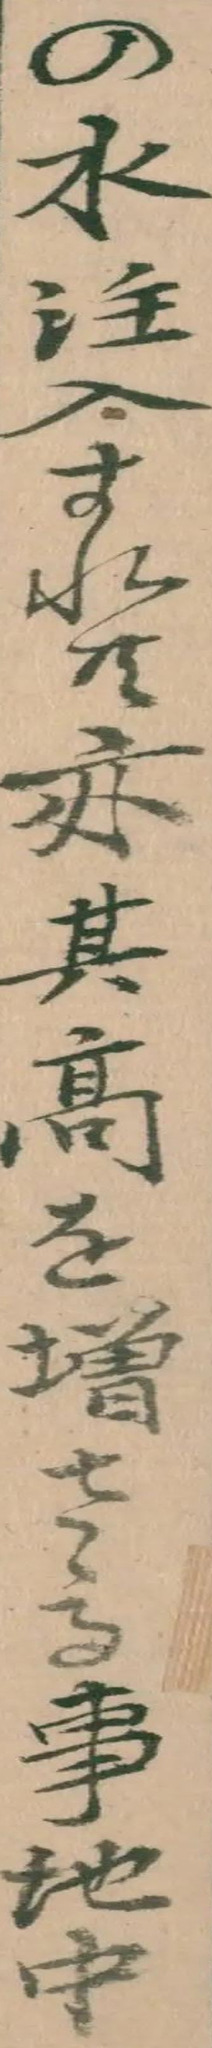の水注入すれ共亦其高を増さゝる事地中
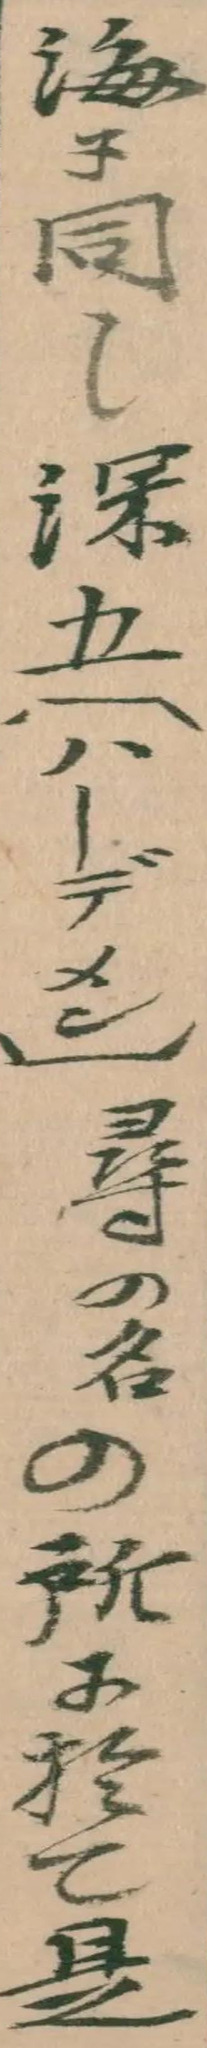海に同し深五(ハーデメン)尋の名の所に於て是
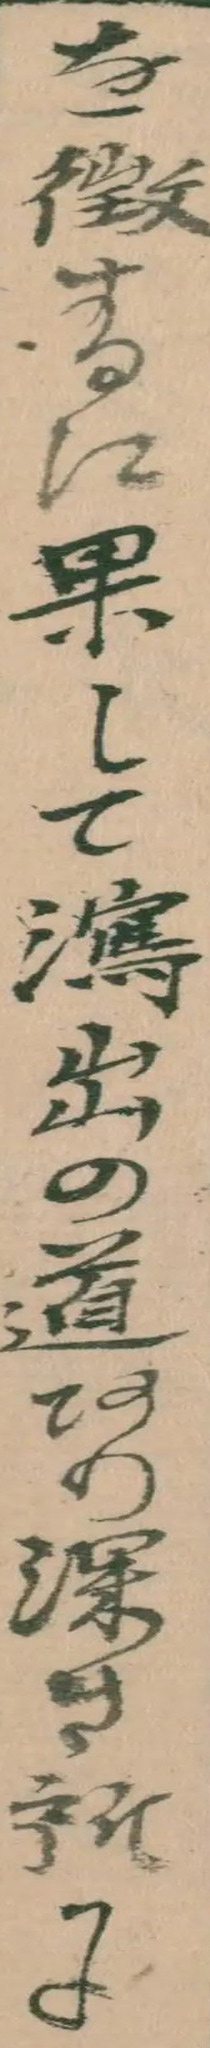を徴するに果して瀉出の道あり深き所に
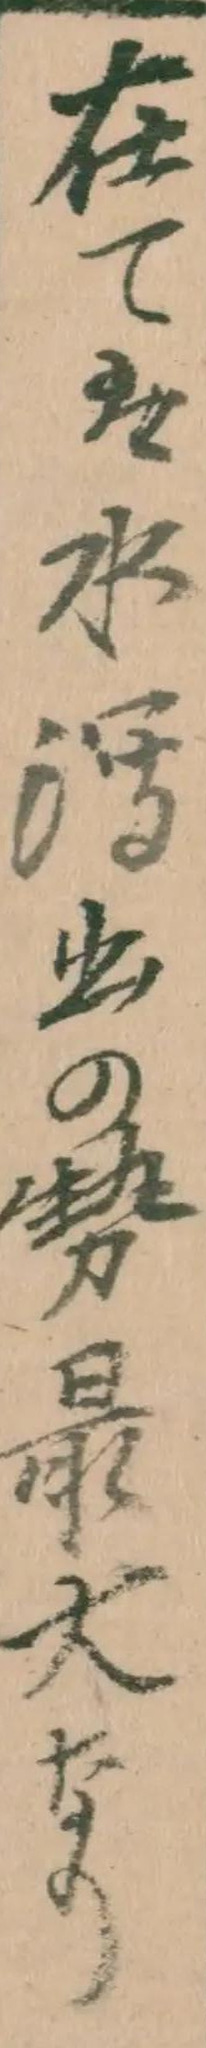在ては水瀉出の勢最大なり
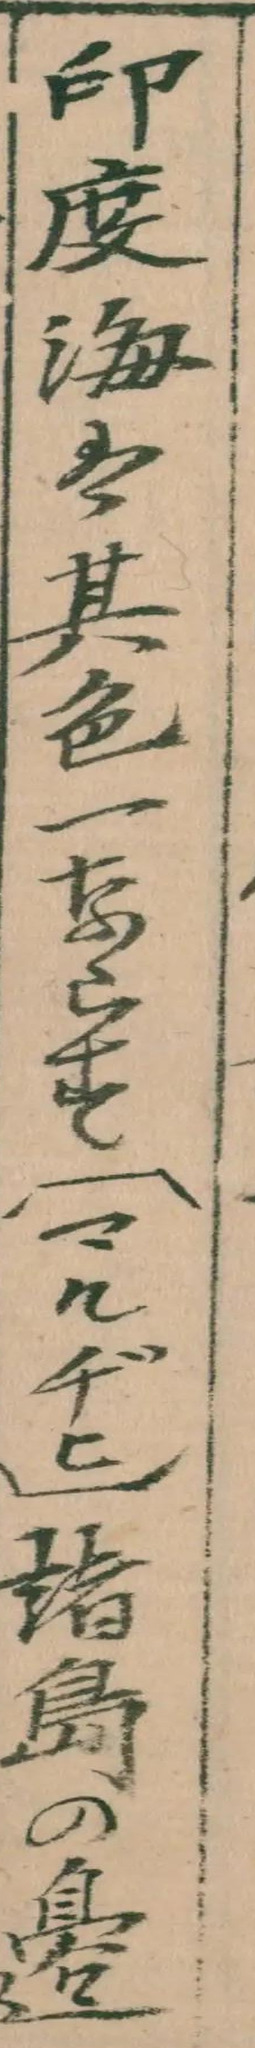印度海は其色一ならす(マルヂヒ)諸島の辺
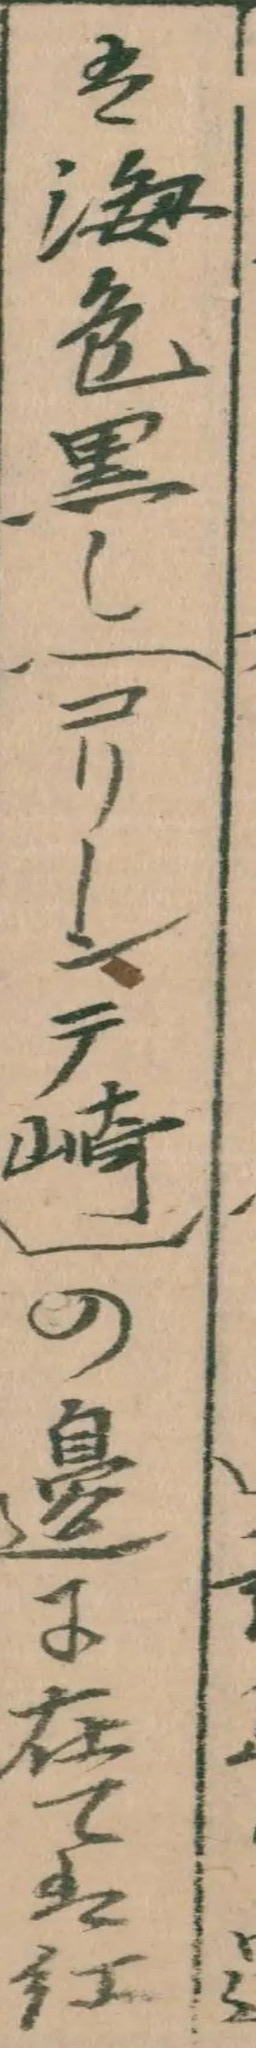は海色黒し(コリーンテ崎)の辺に在ては紅
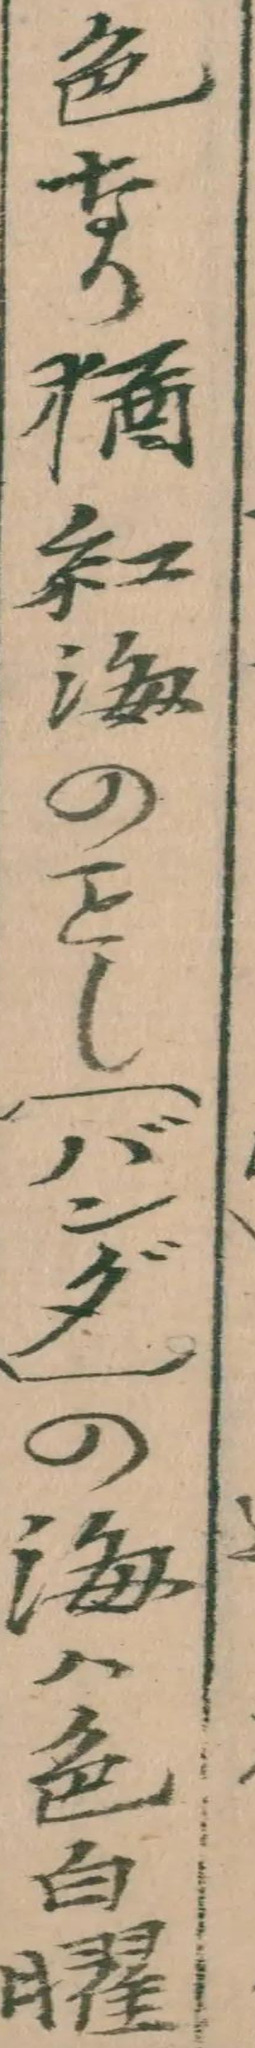色なり猶紅海のことし(バンダ)の海ハ色白曜
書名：新釈輿地図説
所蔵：国立国会図書館 National Diet Library, JAPAN
